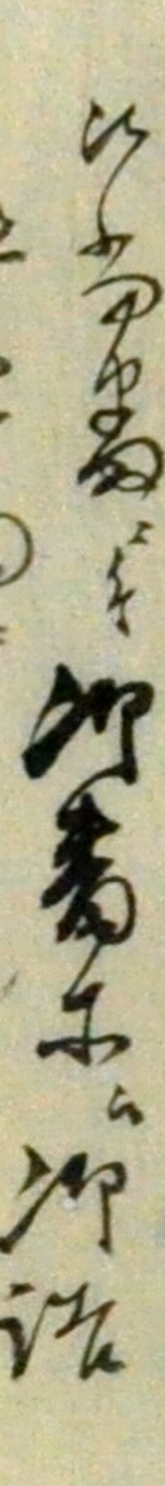御当番ニ付御番所え御詰
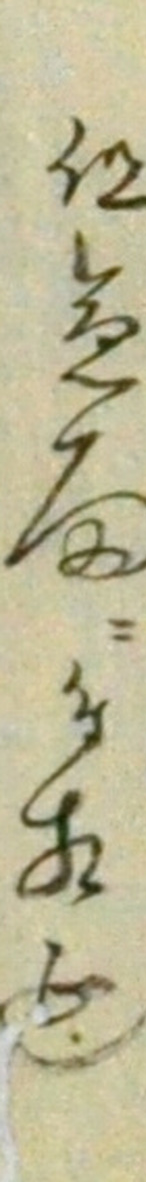但急雨ニ付相延
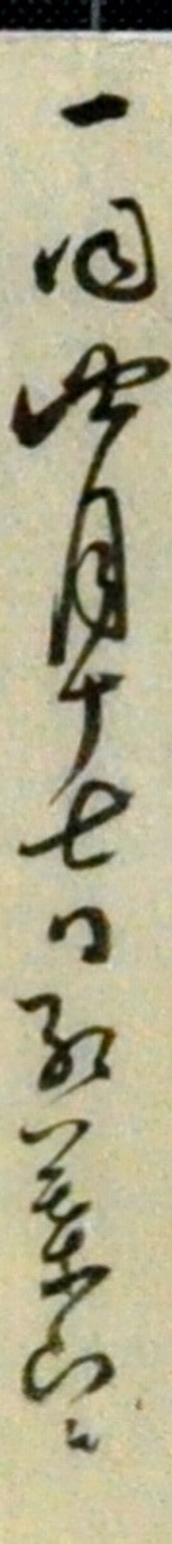一同四月十七日紅葉山江
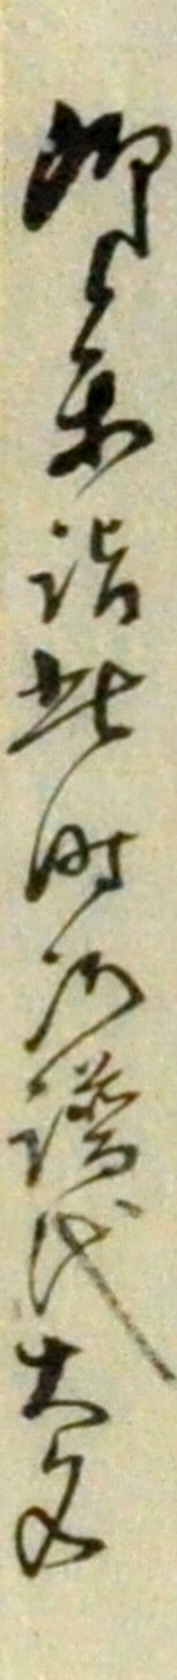御参詣此時御譜代大名
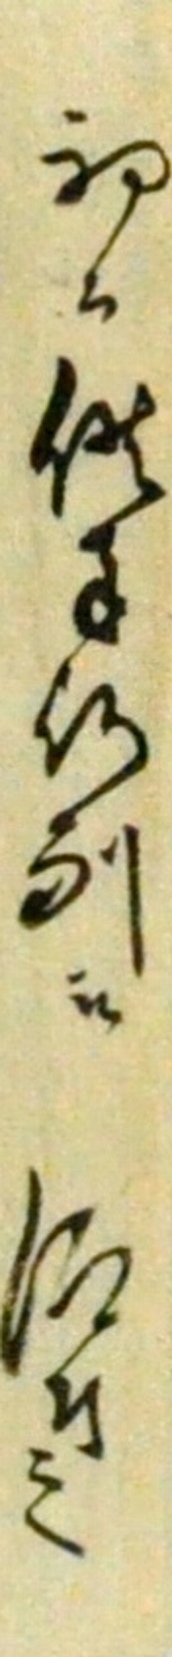初而供奉行列被仰付之
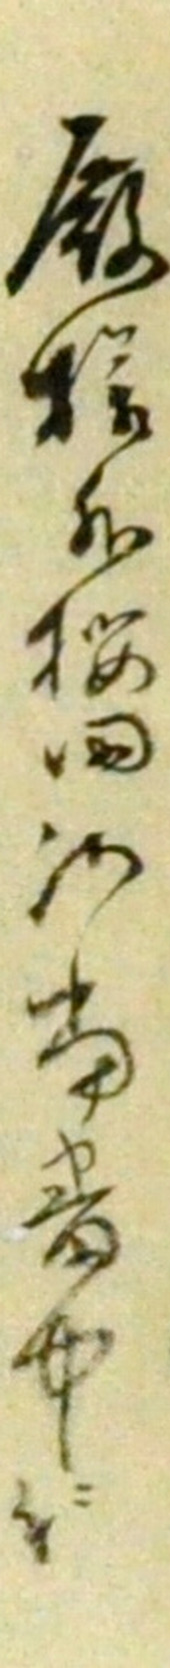殿様外桜田御当番中ニ付
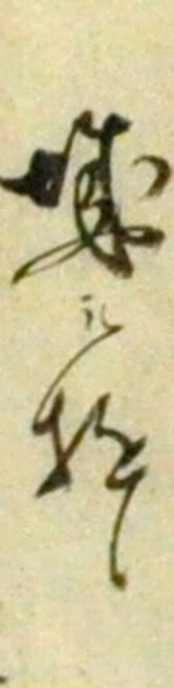城被遊候
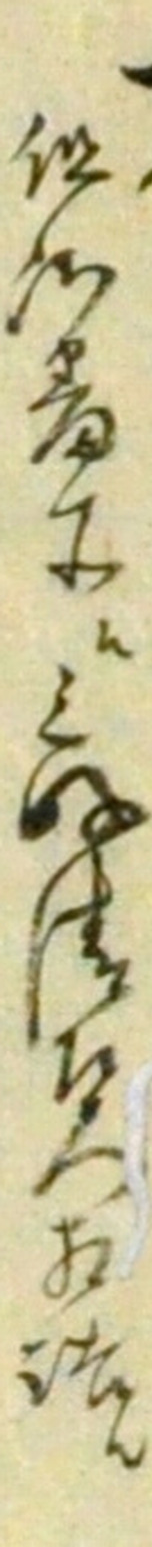但御番所江三好清左衛門相詰ル
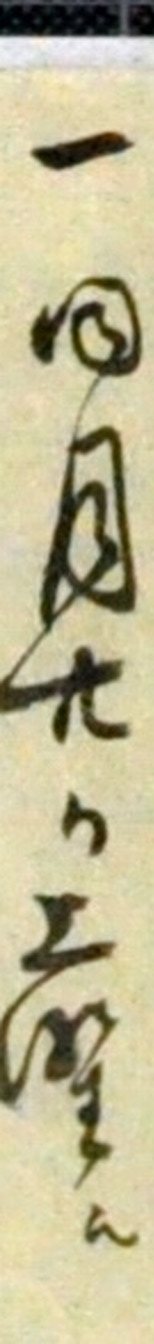一同月廿日上野江
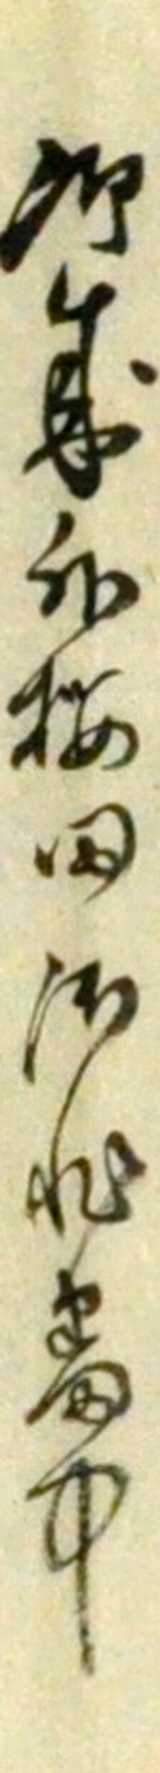御成外桜田御非番中
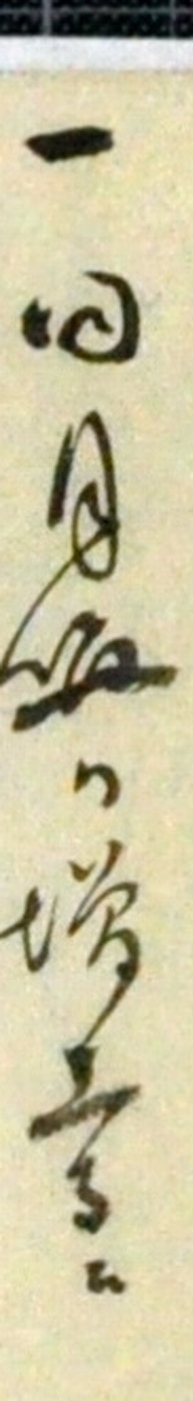一同月晦日増上寺江
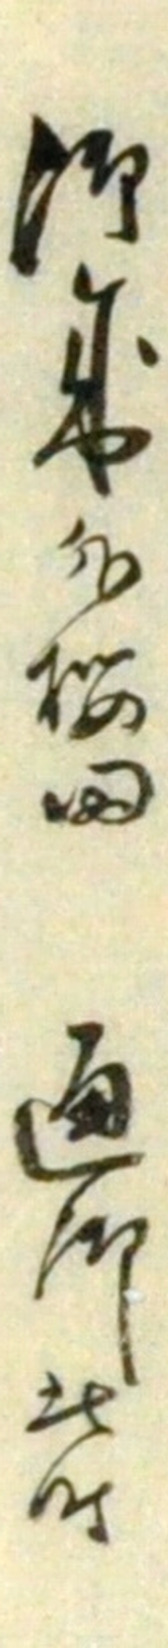御成外桜田通御此時
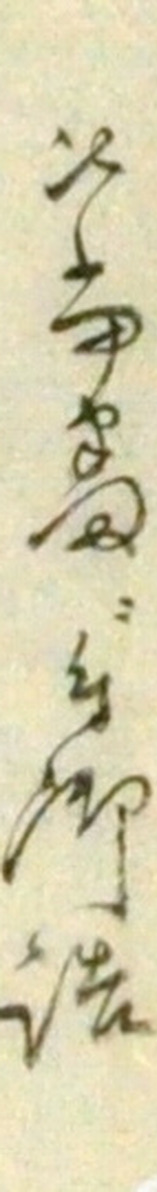御当番ニ付御詰
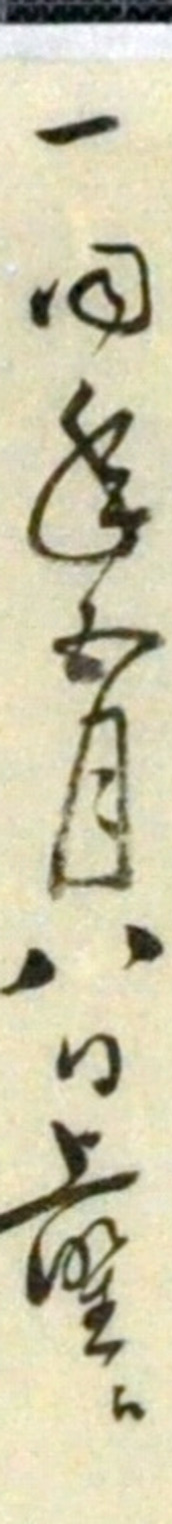一同年五月八日上野江
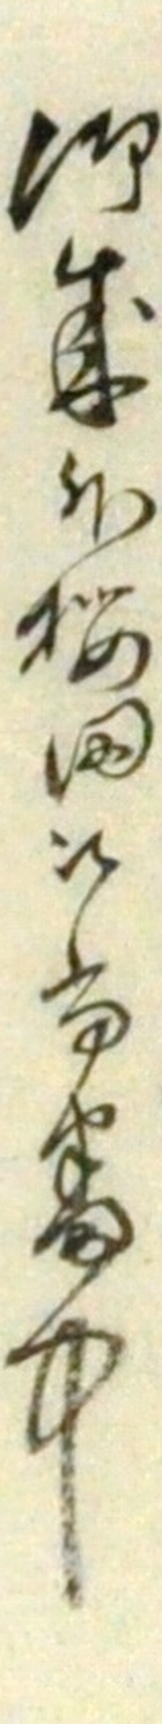御成外桜田御当番中
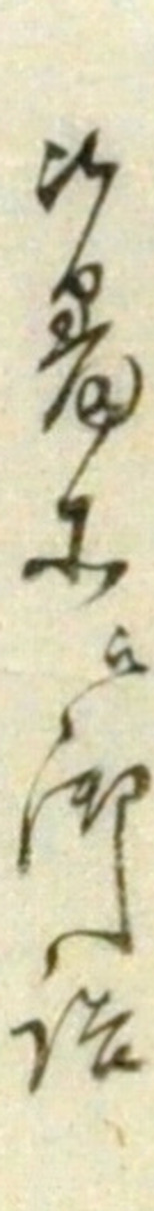御番所江御詰
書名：覚
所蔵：伊那市立高遠町図書館・合同会社AMANE
